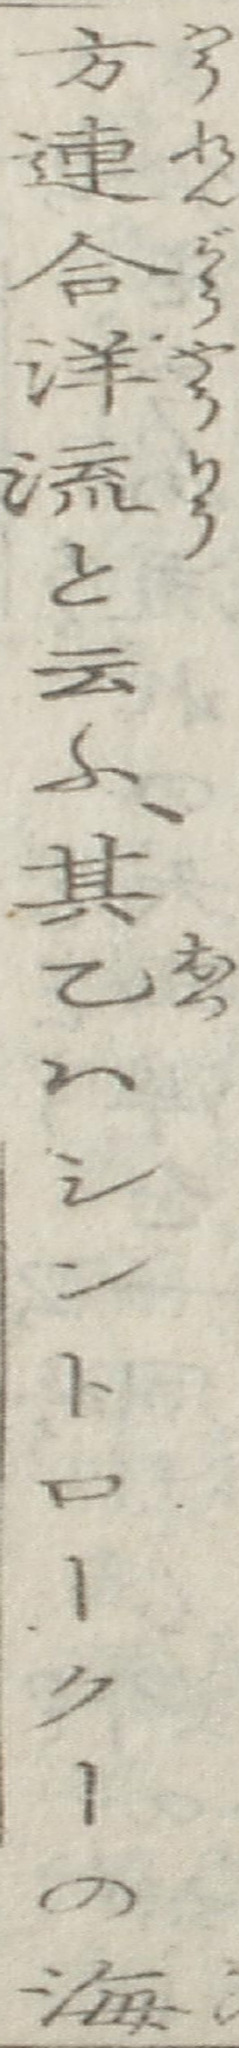方連合洋流と云う、其乙はシントロークーの海
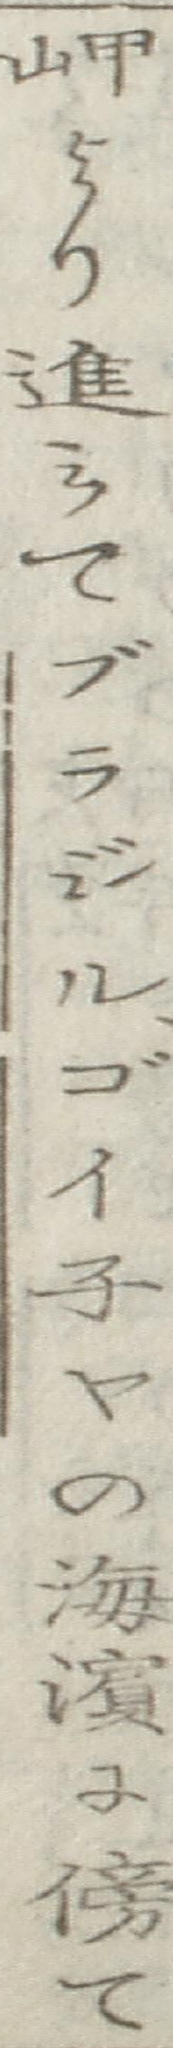岬より進みて、ブラジル、ゴイネヤの海浜に傍て
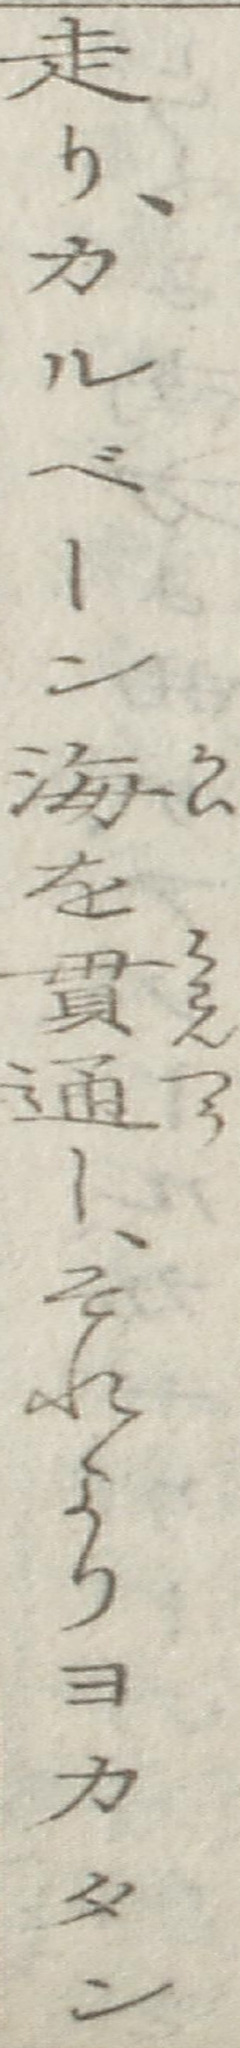走り、カルベーン海を貫通し、それよりヨカタン
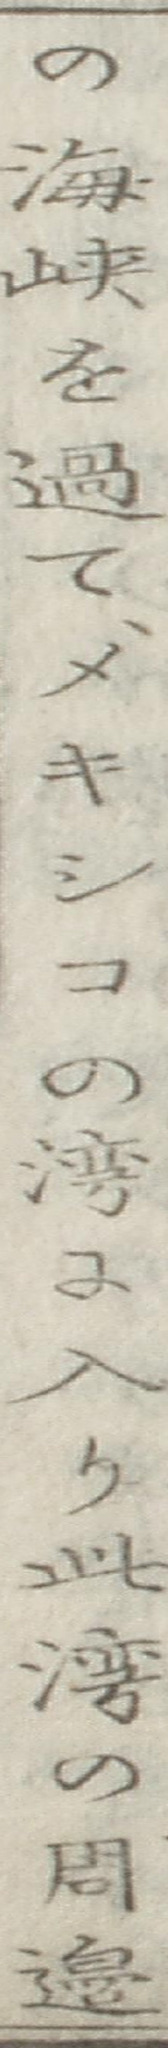の海峡を過て、メキシコの湾に入り、此湾の周辺
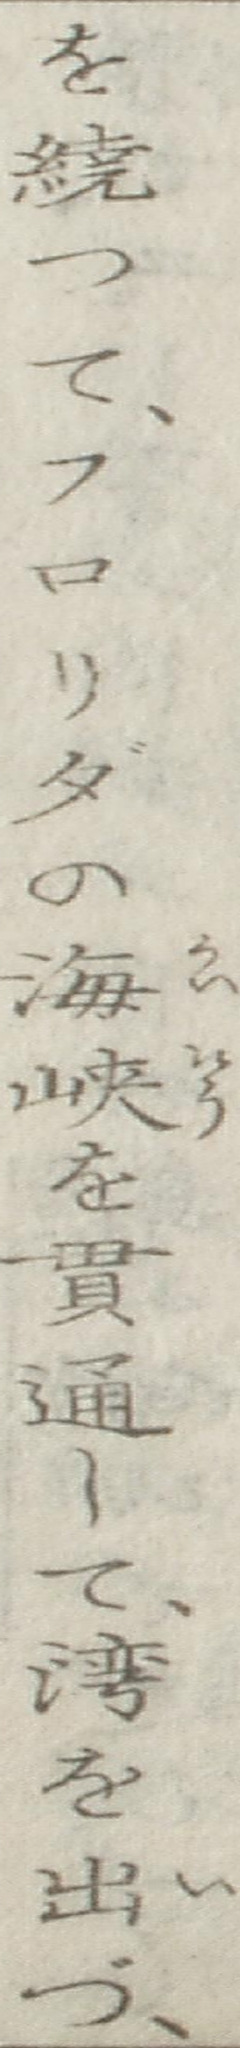を繞つて、フロリダの海峡を貫通して、湾を出づ、
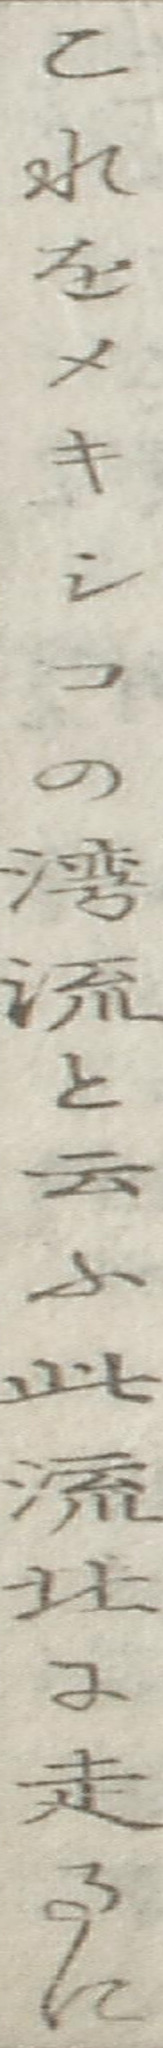之をメキシコの湾流と云ふ、此流北に走るに

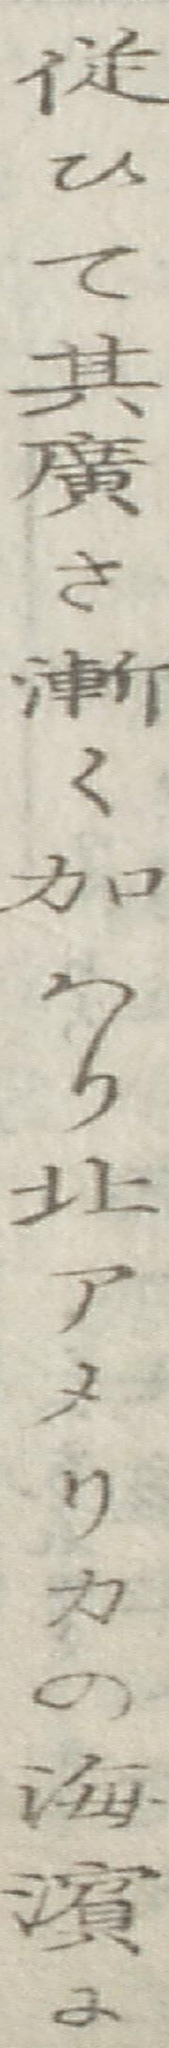従ひて其広さ漸く加はり北アメリカの海浜に
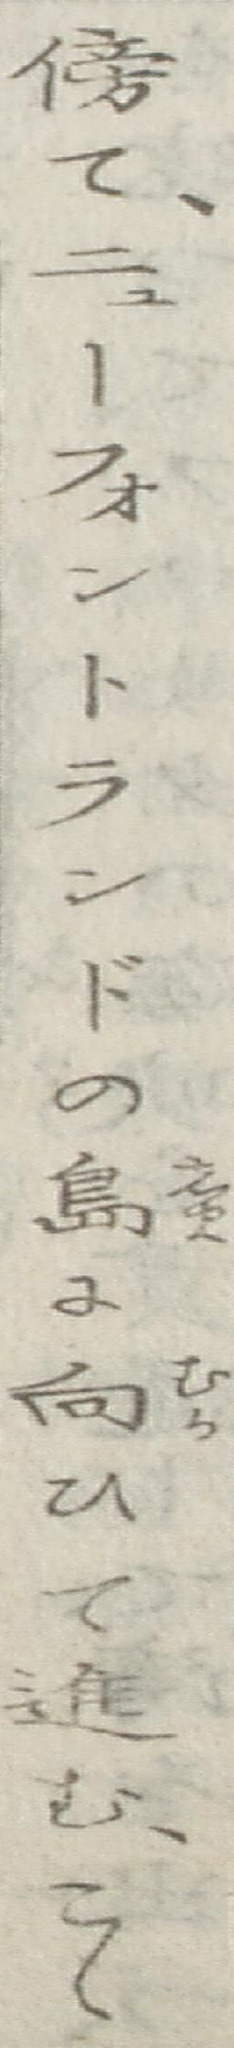傍て、ニューフォントランドの島に向ひて進む、こゝ
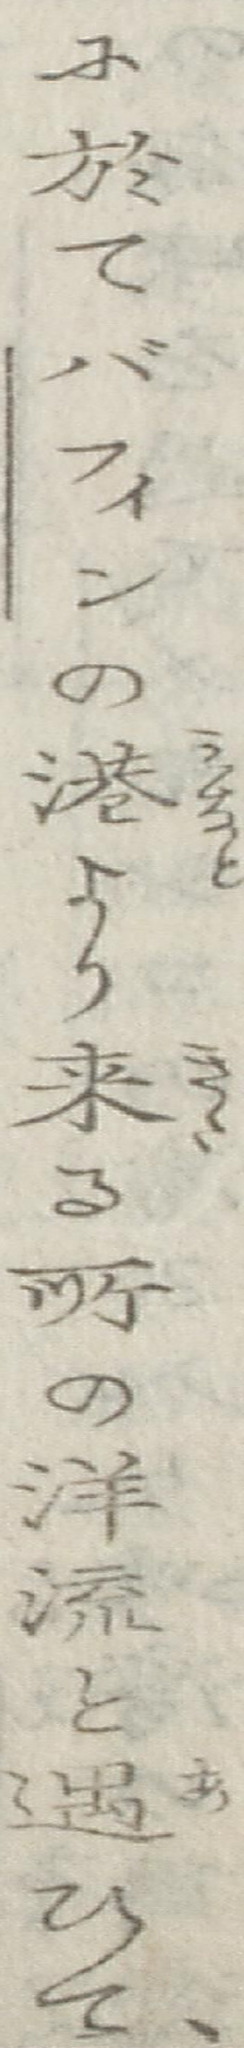に於いてバフィンの港より来る所の洋流と遇ひて、
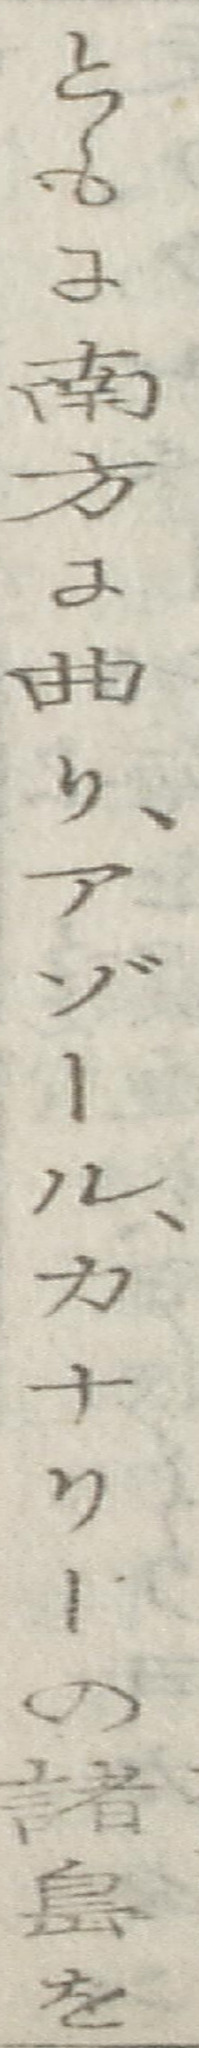ともに南方に曲り、アゾール、カナリーの諸島を
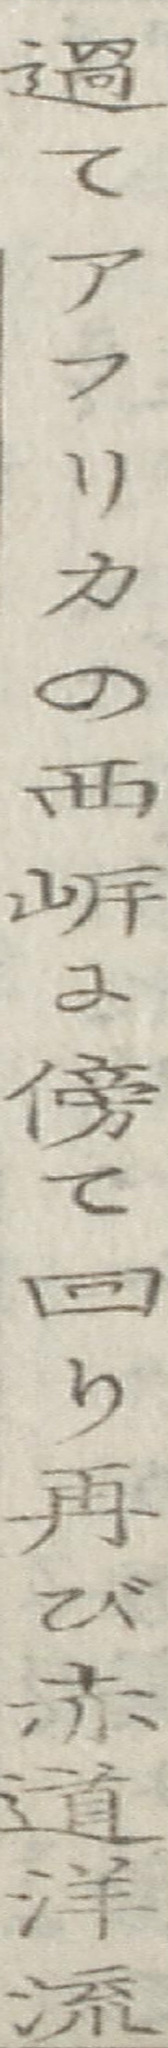過て、アフリカの西岸に傍て回り再び赤道洋流
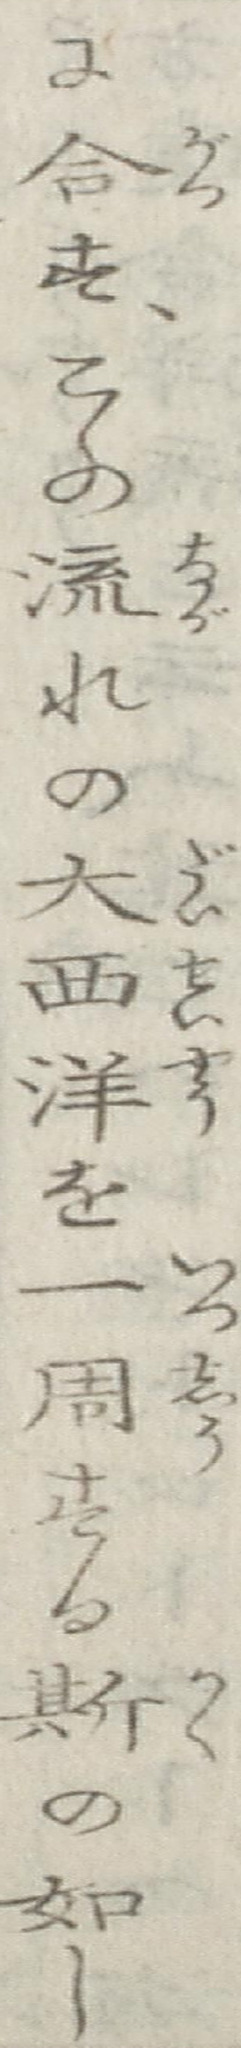に合す、その流れの大西洋を一周する斯の如し
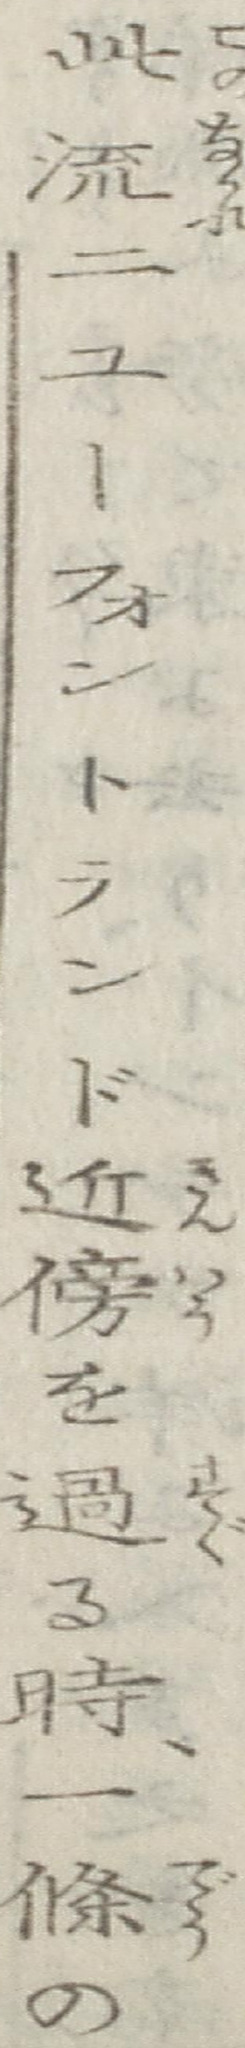此流ニユーフォントランド近傍を過る時、一條の
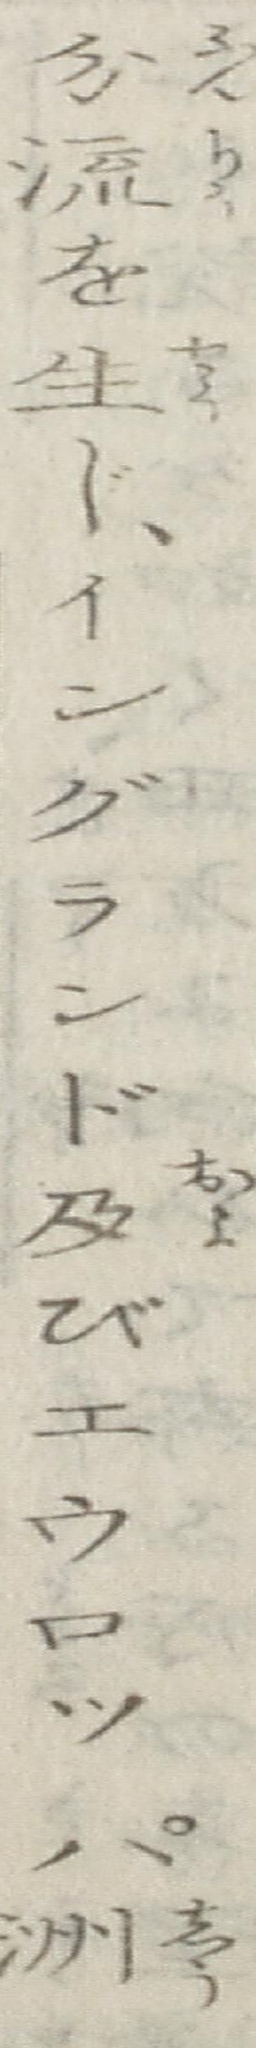分流を生じ、イングランド及びエウロツパ洲
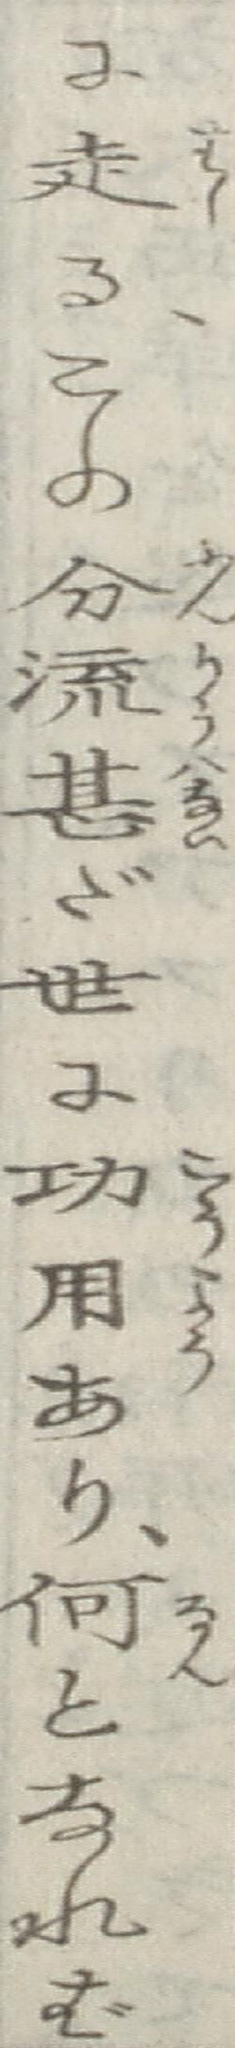に走る、この分流甚だ世に功用あり、何となれば
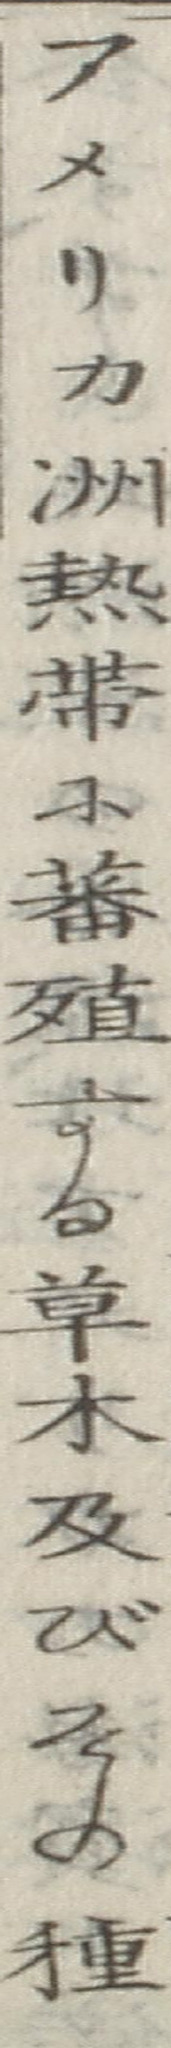アメリカ洲熱帯に蕃殖する草木及びその種
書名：訓蒙　天然地理學　中
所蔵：東京大学地震研究所図書室 Earthquake Research Institute Library, The University of Tokyo, JAPAN
